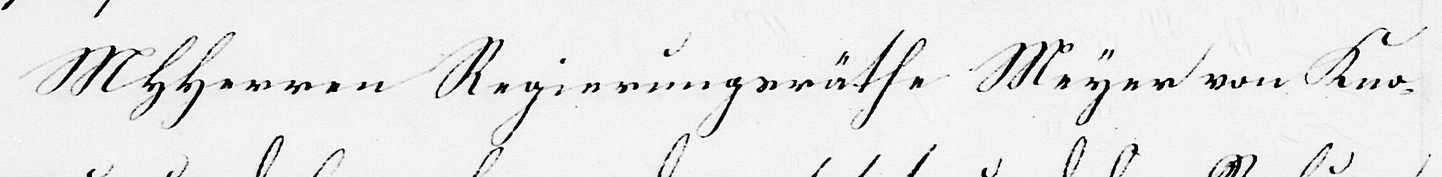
MHHerren Regierungsräthe Meyer von Kno¬
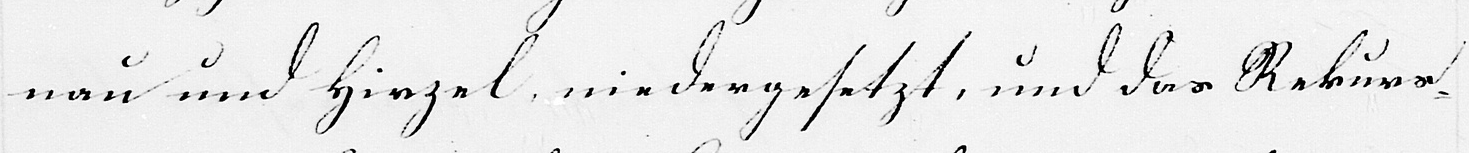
nau und Hirzel niedergesetzt, und das Rekurs¬
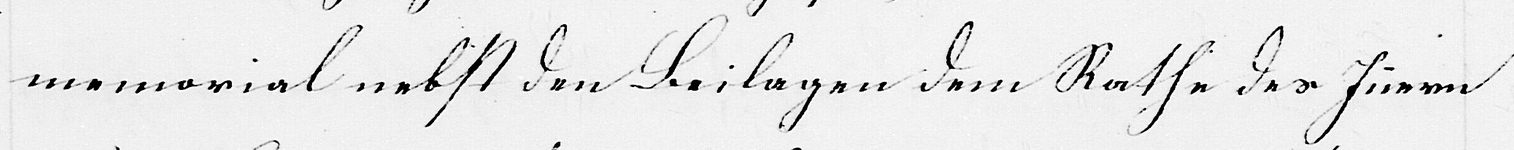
memorial nebst den Beilagen dem Rathe des Innern
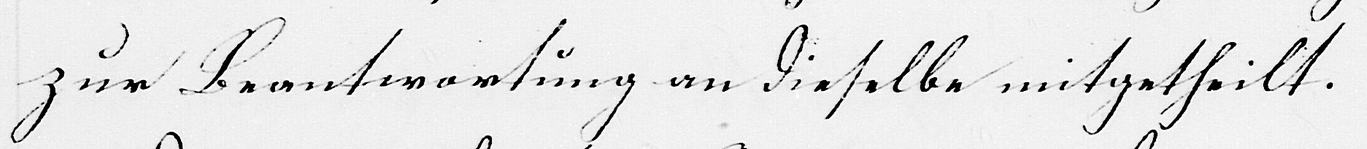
zur Beantwortung an dieselbe mitgetheilt.
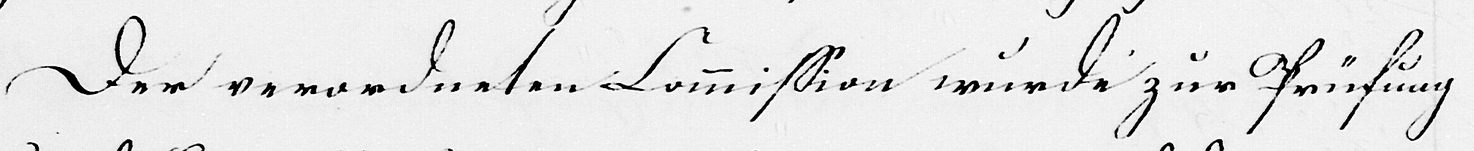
Der verordneten Commißion wurde zur Prüfung
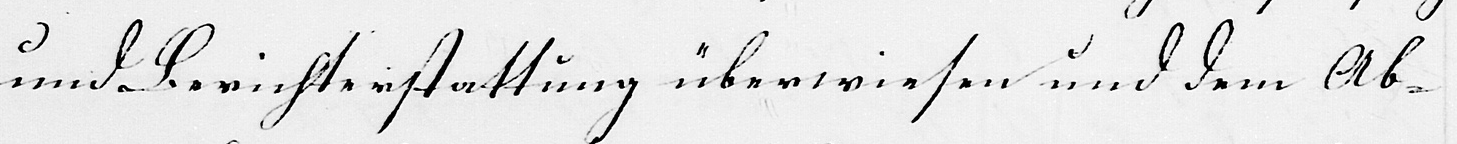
und Berichterstattung überwiesen und dem Ab¬
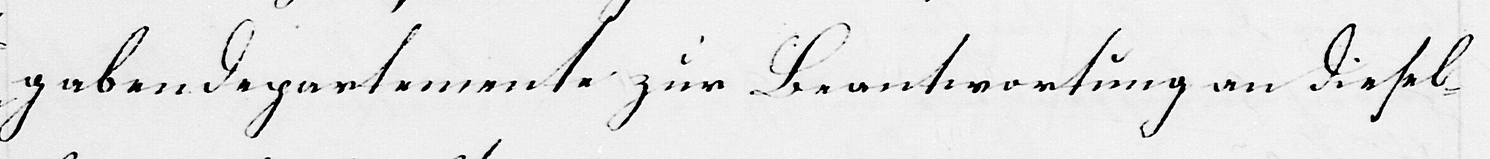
gabendepartemente zur Beantwortung an diesel¬
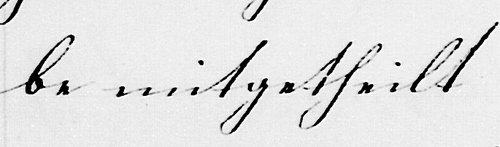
be mitgetheilt
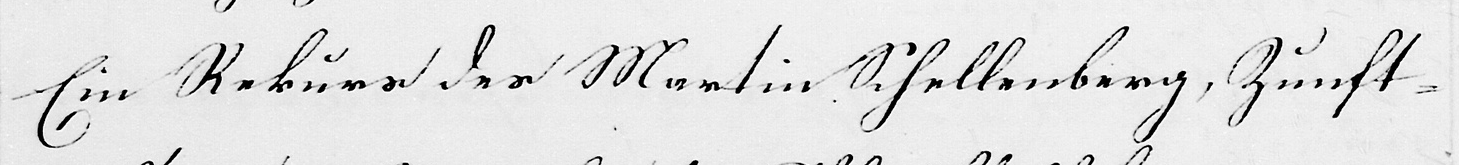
Ein Rekurs des Martin Schellenberg, Zunft¬
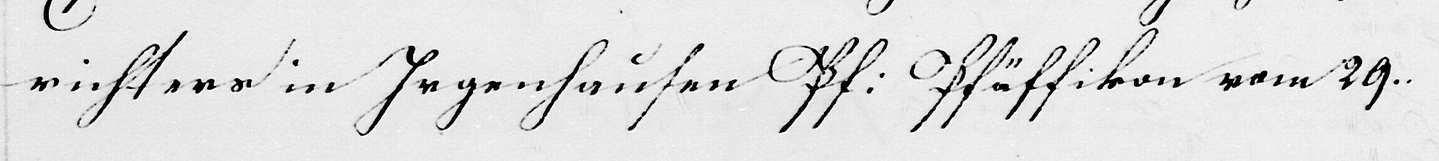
richters in Ingenhausen Pf: Pfäffikon vom 29.
